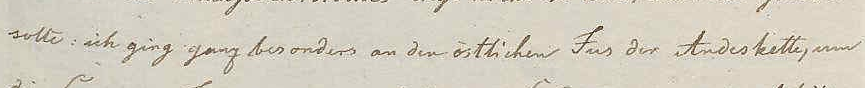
solte: ich ging ganz besonders an den östlichen Fus der Andeskette, um
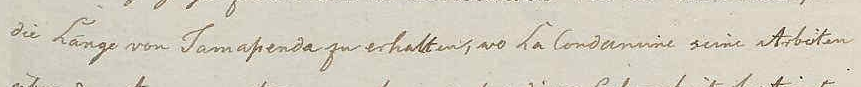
die Länge von Tamapenda zu erhalten, wo La Condamine seine Arbeiten
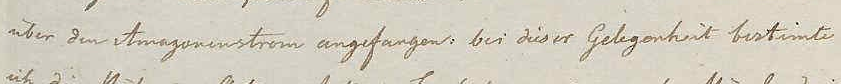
über den Amazonenstrom angefangen: bei dieser Gelegenheit bestimte
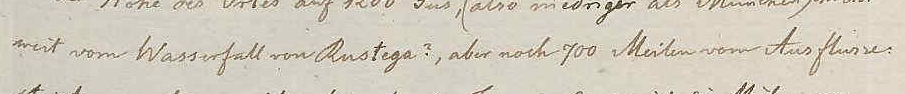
weit vom Wasserfall von Rustega ?, aber noch 700 Meilen vom Ausflusse:
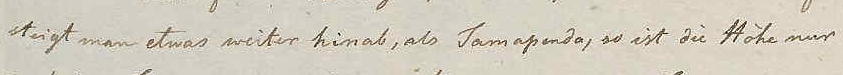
steigt man etwas weiter hinab, als Tamapenda, so ist die Höhe nur
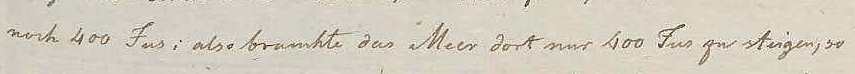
noch 400 Fus: also brauchte das Meer dort nur 400 Fus zu steigen, so
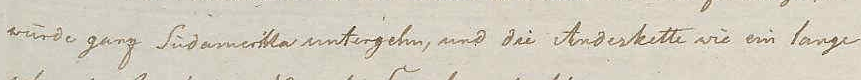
würde ganz Südamerika untergehn, und die Andeskette wie ein lange
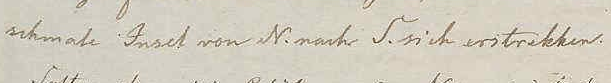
schmale Insel von N. nach S. sich erstrekken.
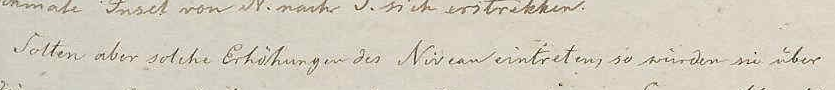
Solten aber solche Erhöhungen des Niveau eintreten, so würden sie über
